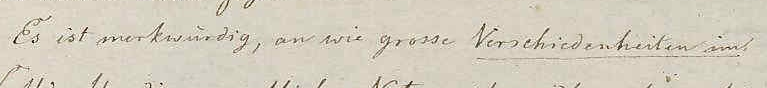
Es ist merkwürdig, an wie grosse Verschiedenheiten im
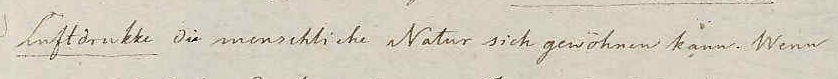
Luftdrukke die menschliche Natur sich gewöhnen kann. Wenn
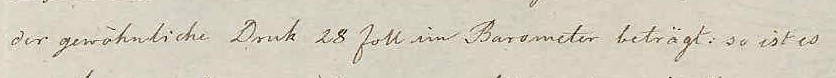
der gewöhnliche Druk 28 Zoll im Barometer beträgt: so ist es
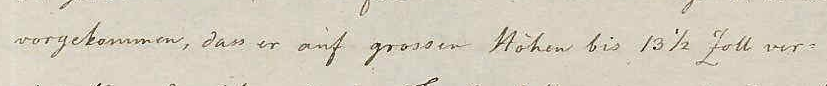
vorgekommen, dass er auf grossen Höhen bis 13½ Zoll ver-
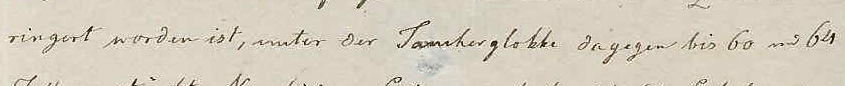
ringert worden ist, unter der Taucherglokke dagegen bis 60 und 64
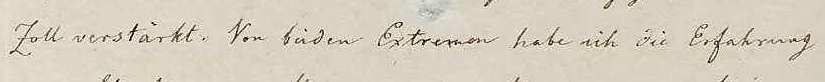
Zoll verstärkt. Von beiden Extremen habe ich die Erfahrung
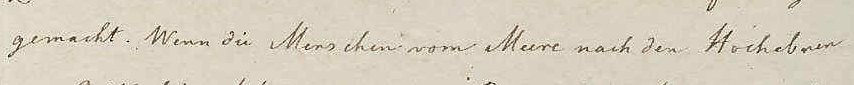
gemacht. Wenn die Menschen vom Meere nach den Hochebnen
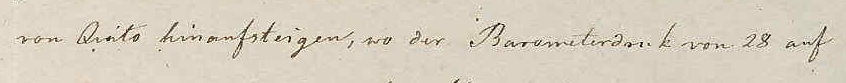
von Quito hinaufsteigen, wo der Barometerdruk von 28 auf
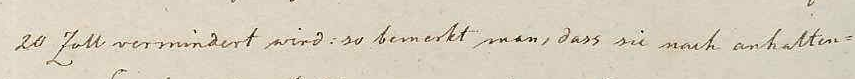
20 Zoll vermindert wird: so bemerkt man, dass sie nach anhalten-
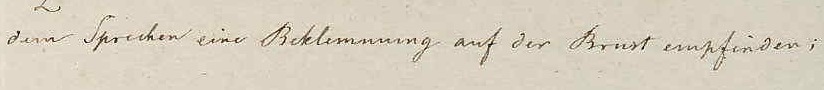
dem Sprechen eine Beklemmung auf der Brust empfinden;
